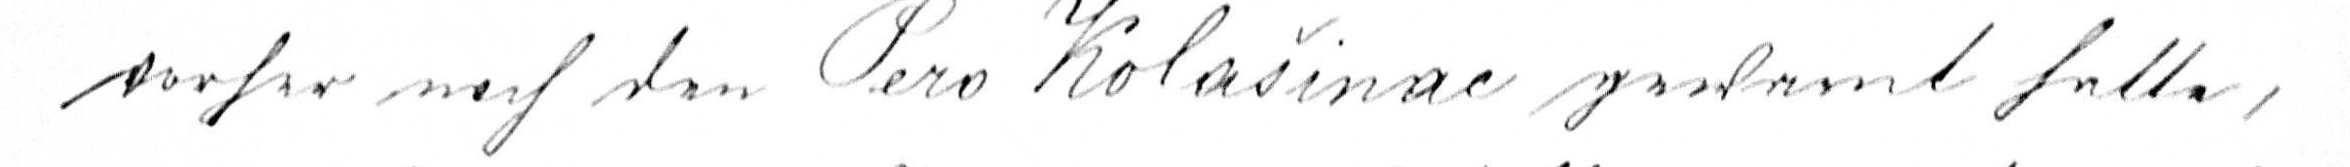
vorher noch den Pero Kolašinac gewarnt hatte,
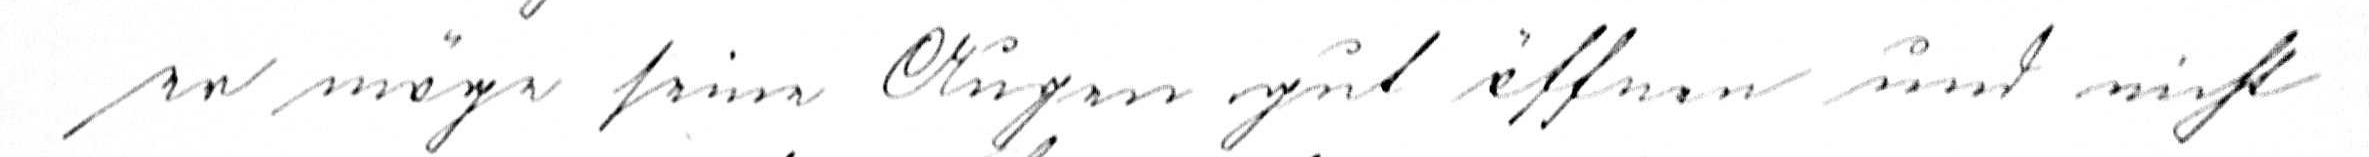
er möge seine Augen gut öffnen und nicht
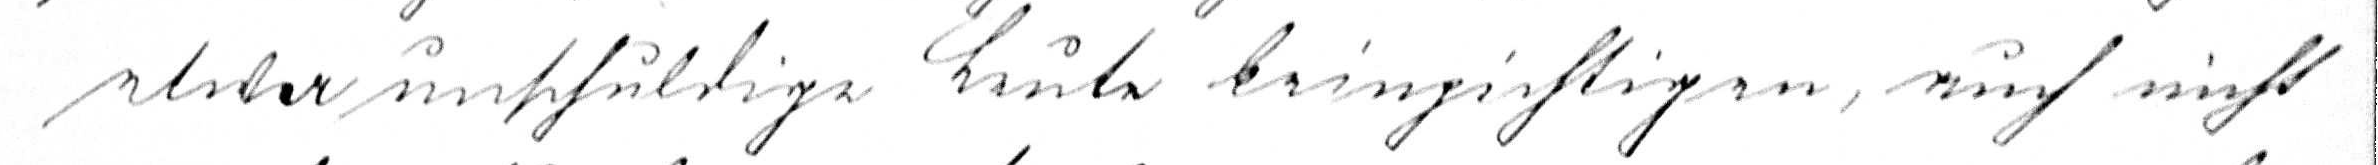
etwa unschuldige Leute beinzichtigen, auch nicht
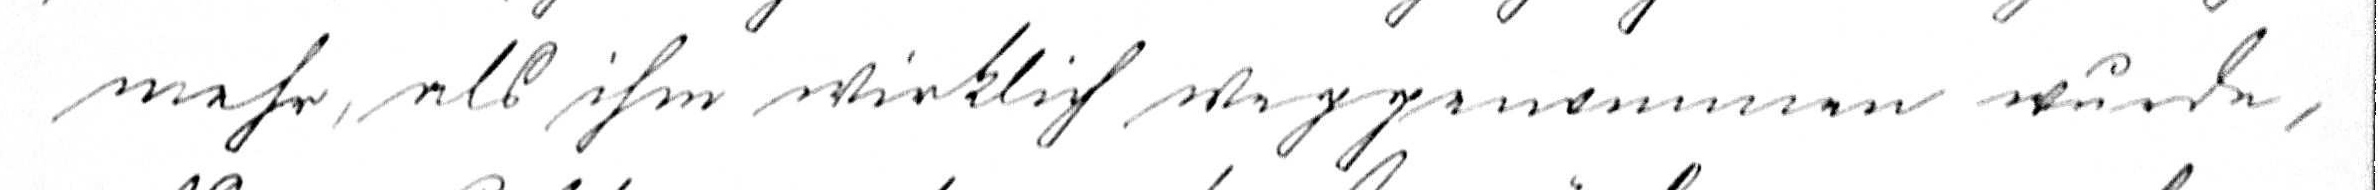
mehr, als ihm wirklich weggenommen wurde,
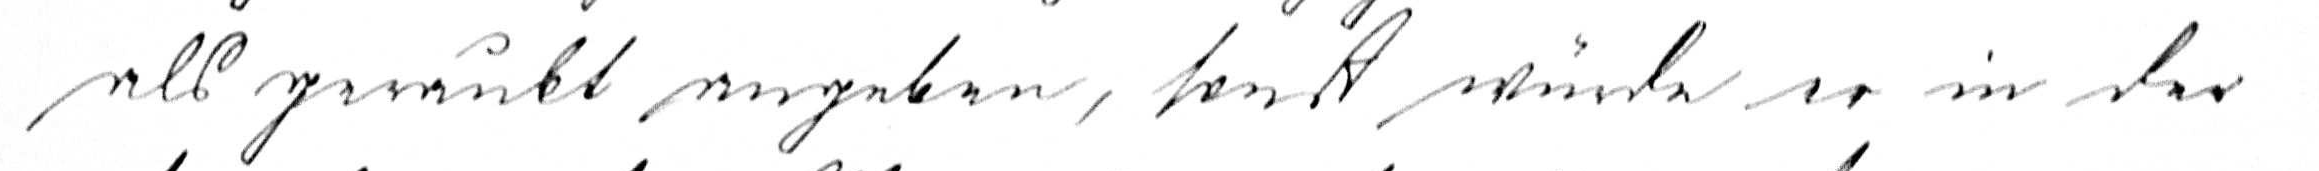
als geraubt angeben, sonst würde er in der
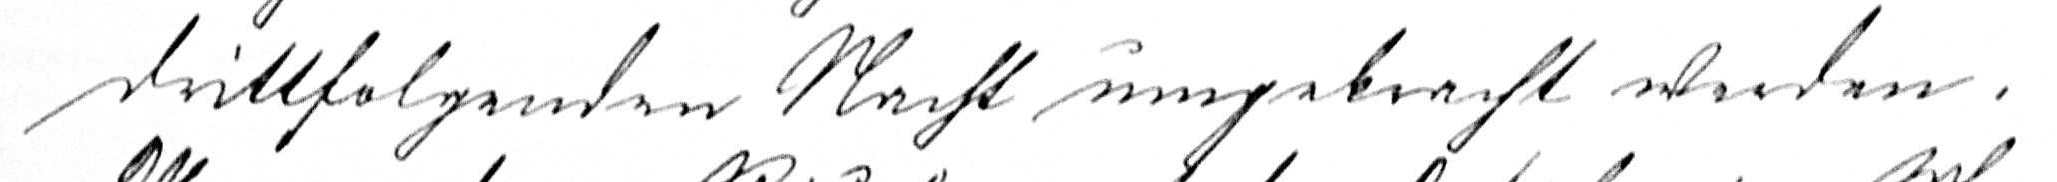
drittfolgenden Nach umgebracht werden.
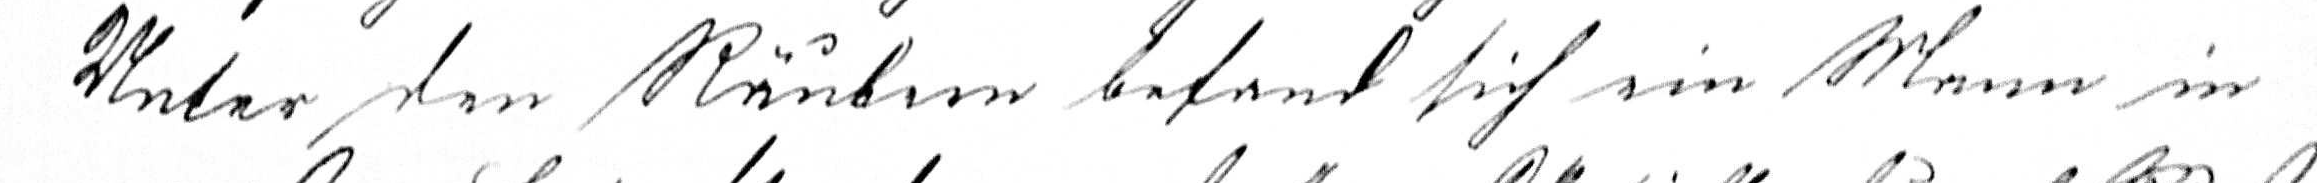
Unter den Räubern befand sich ein Mann in
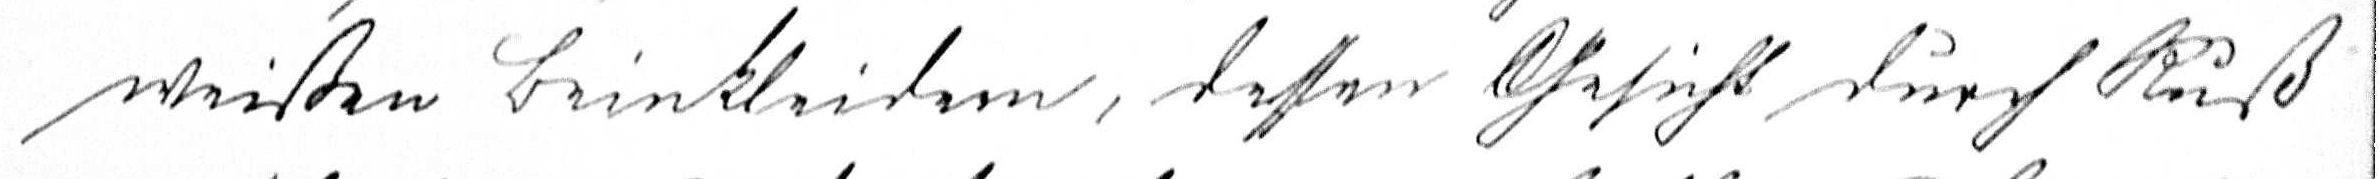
weißen Beinkleidern, dessen Gesicht durch Ruß
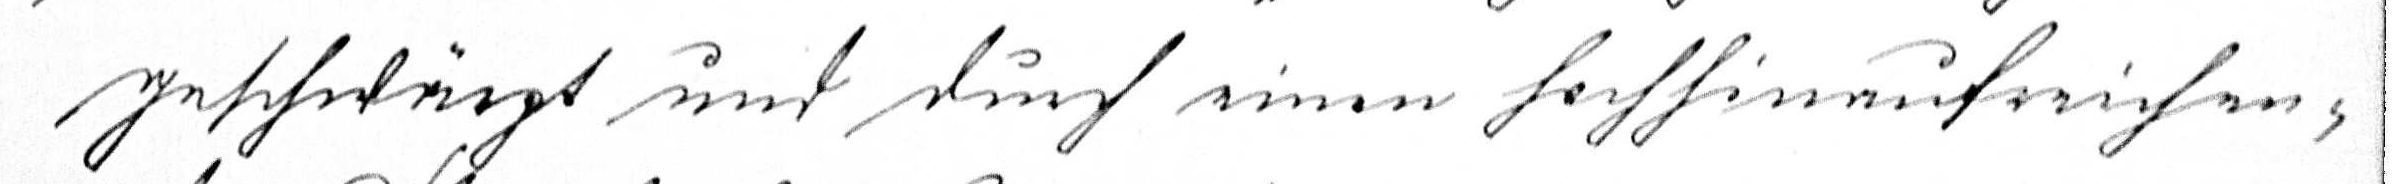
geschwärzt und durch einen hochhinaufreichen¬
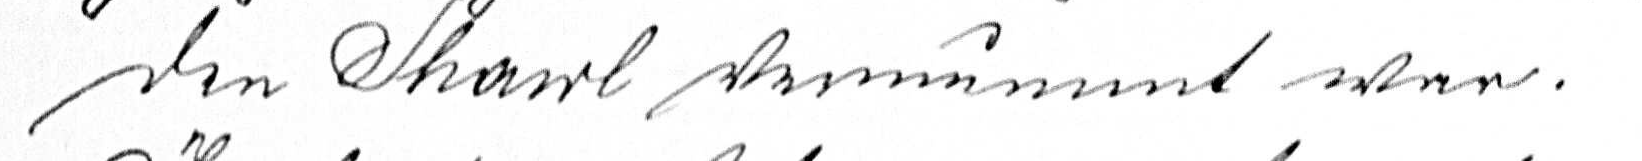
den Shawl vermummt war.
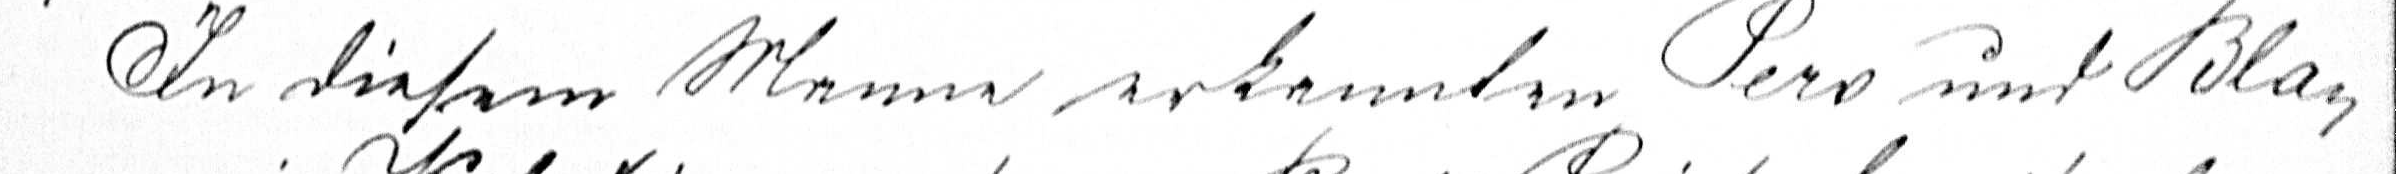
In diesem Manne erkannten Pero und Bla¬
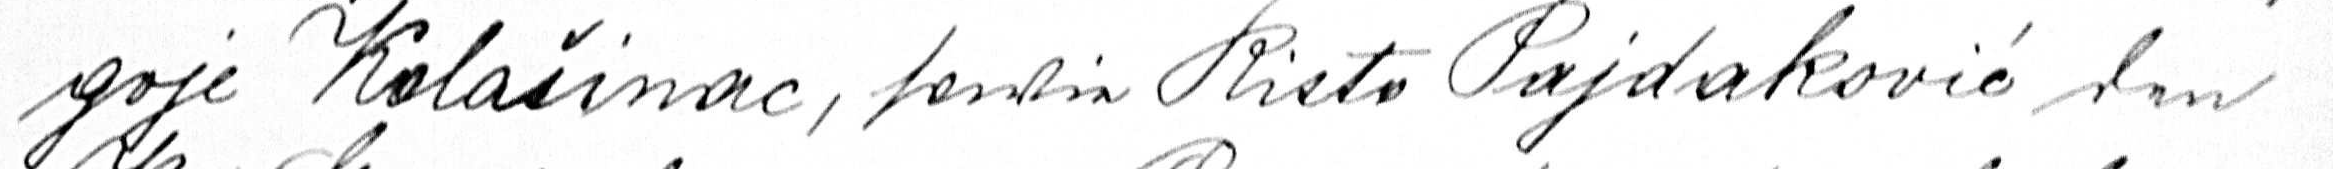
goje Kolašinac, sowie Risto Pajdaković den
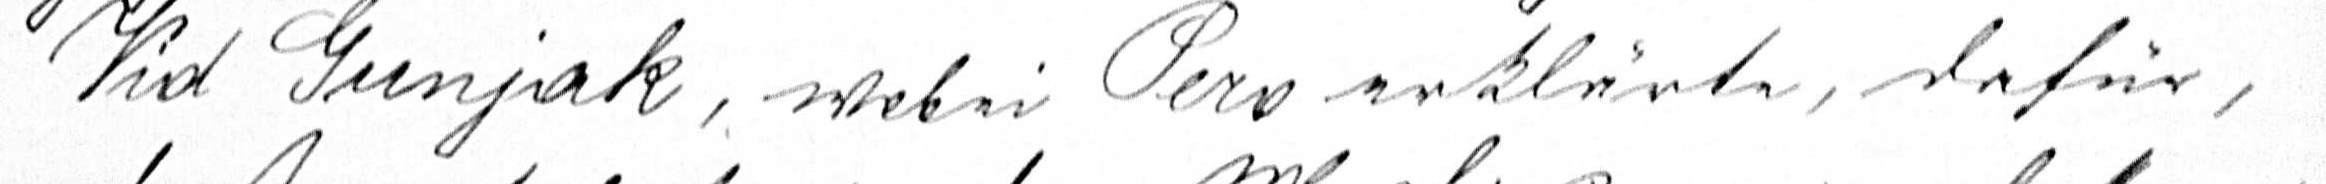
Vid Gunjak, wobei Pero erklärte, dafür,
